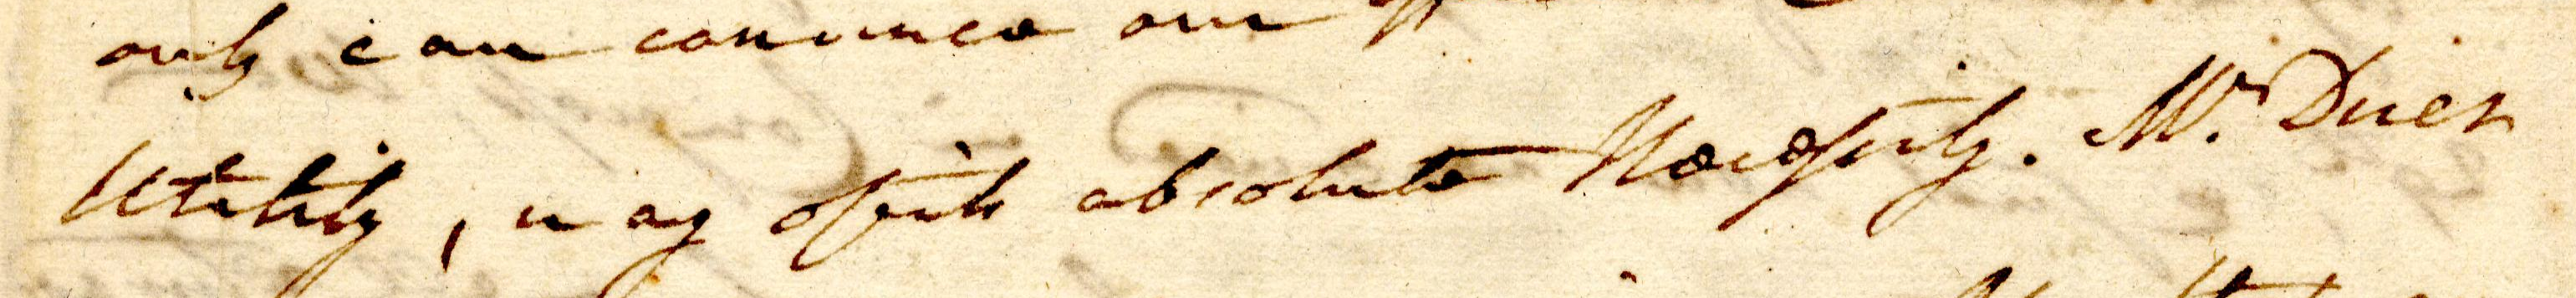Utility, was often absolute necessity. M^r. Duer
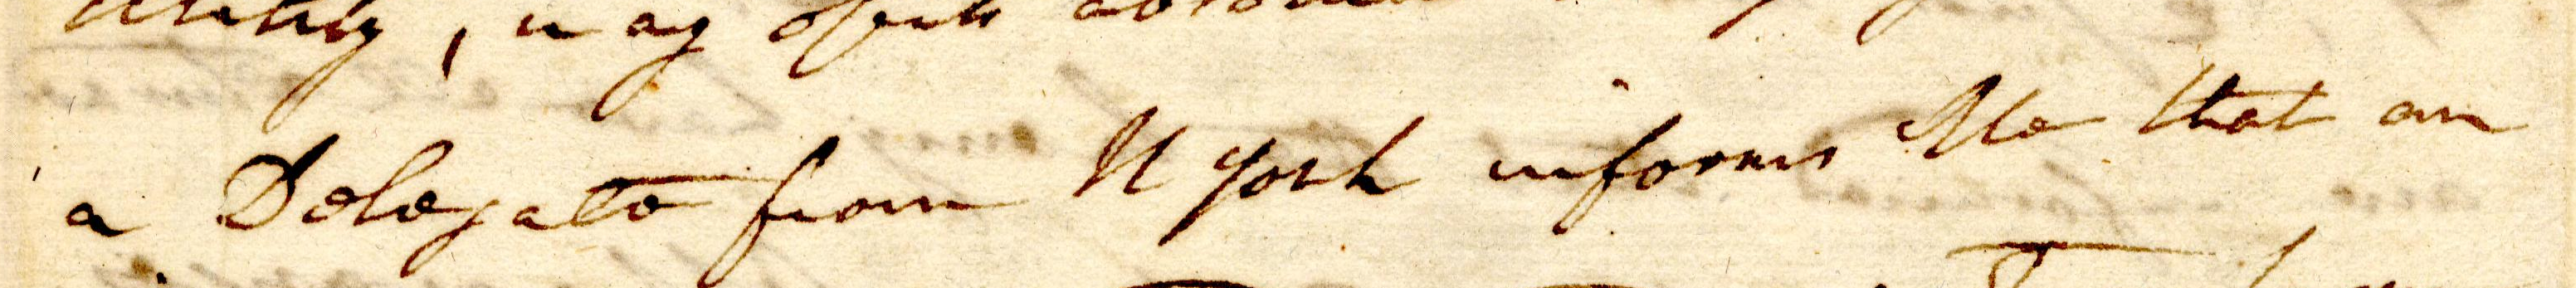a Delegate from N York informs me that an
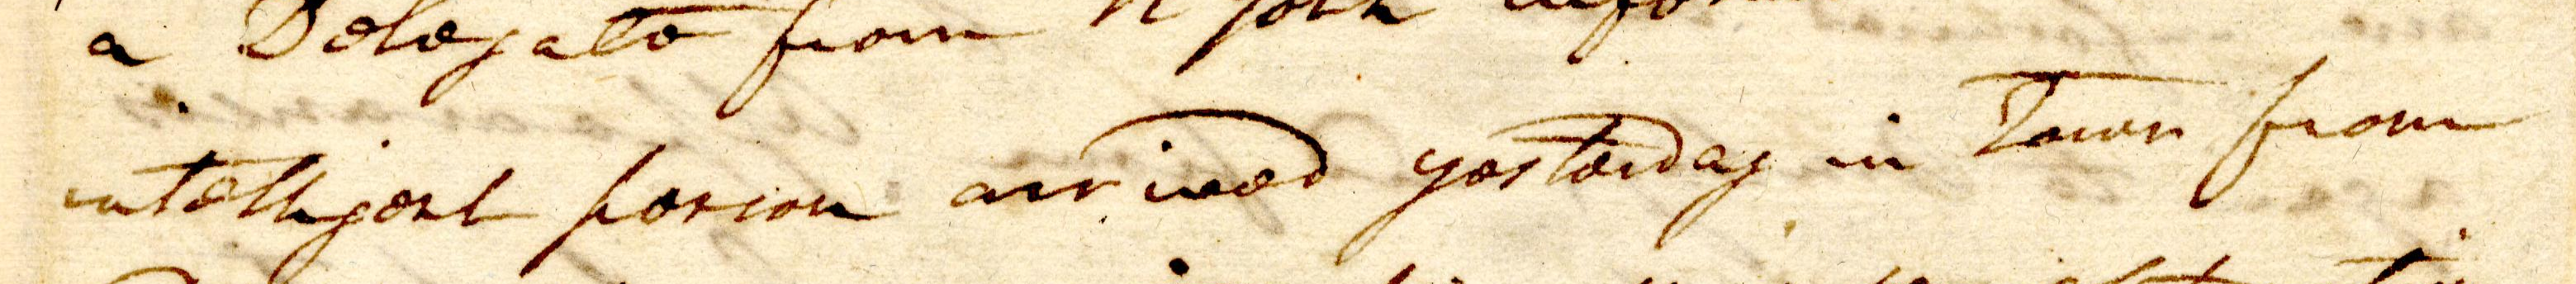intelligent person arrived yesterday in Town from
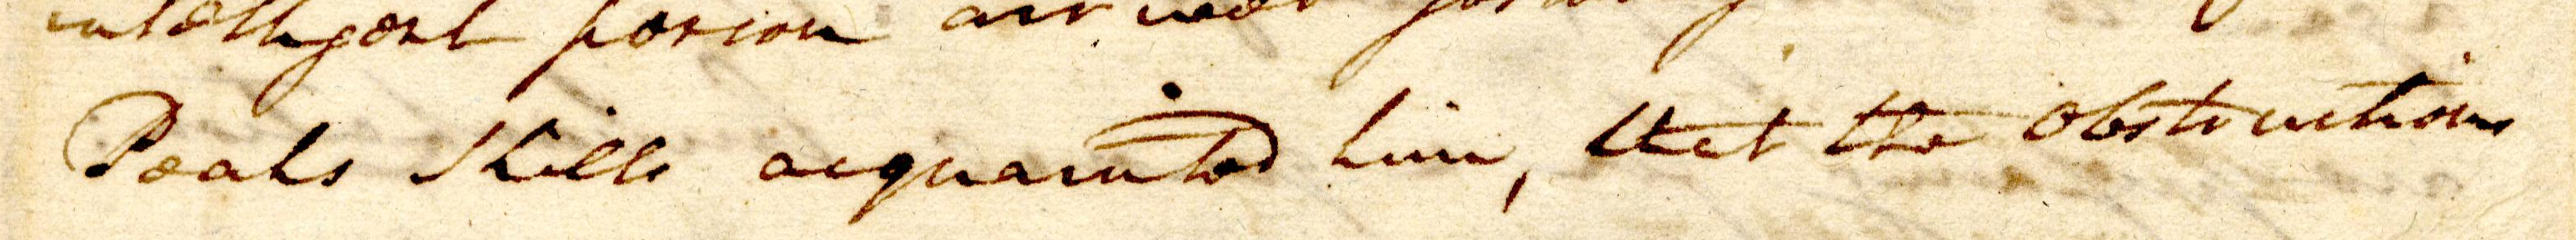Peaks skills acquainted him, that the obstructions
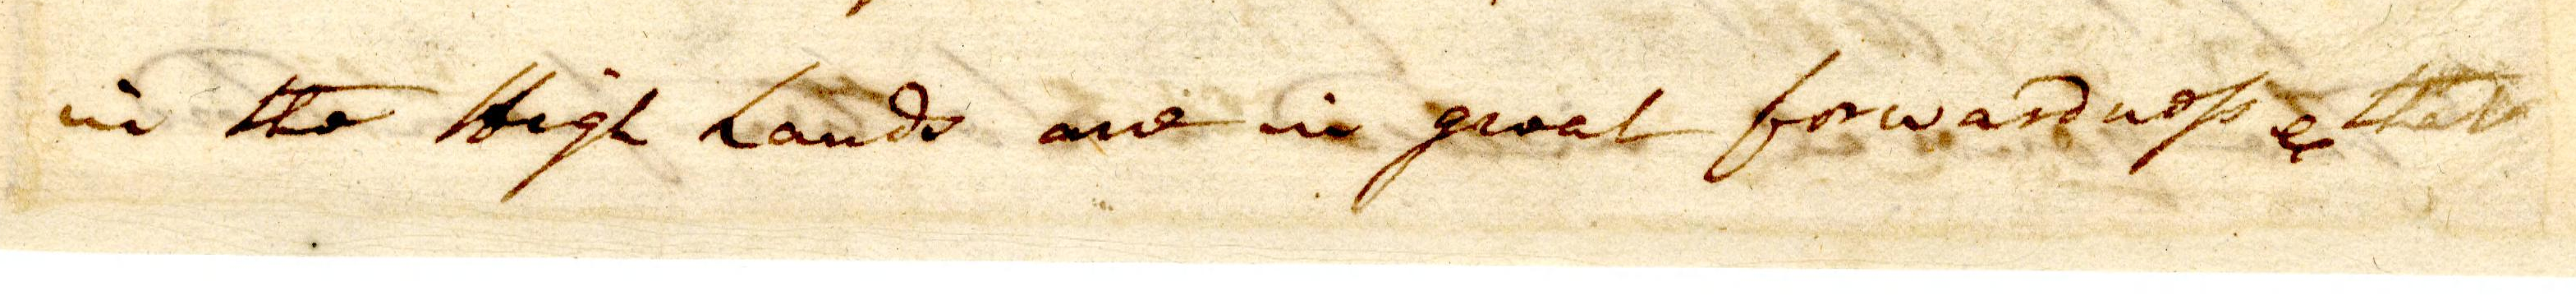in the High Lands and in great forwardness Is that
